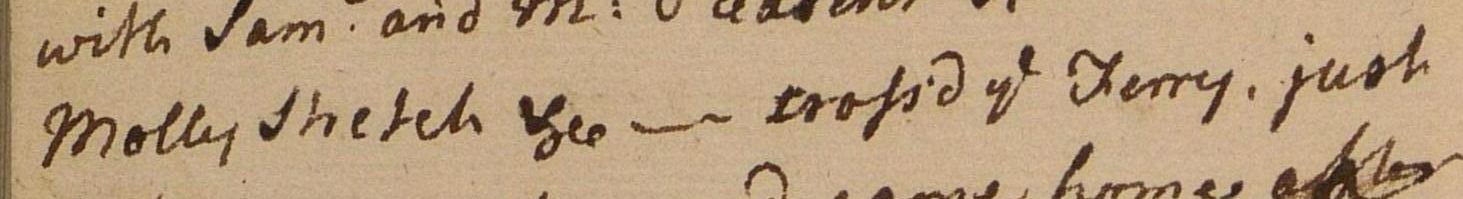Molly Shetch &c- cross'd y^e Ferry, just
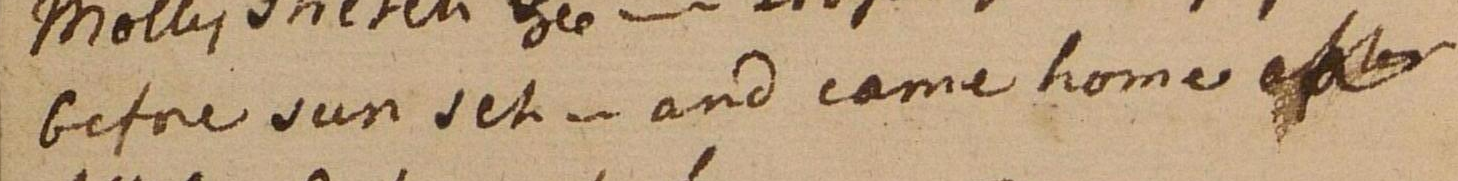before sun set- and came home [___]
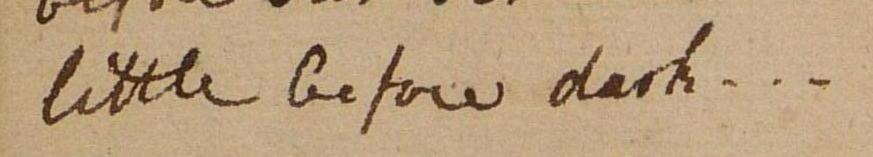little before dark...
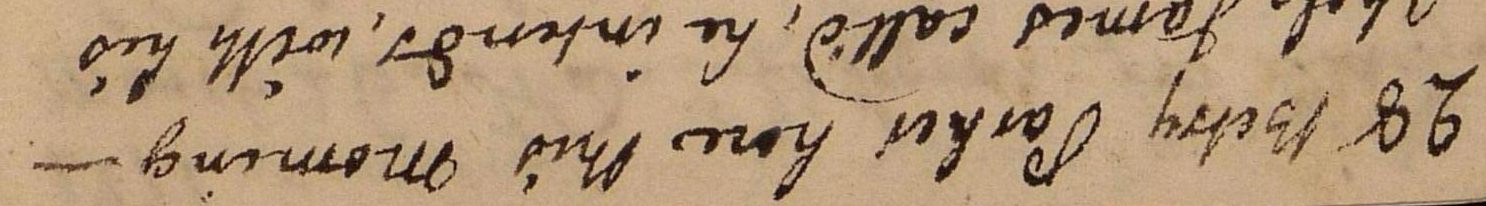28 Betsy Parker here this Morning-
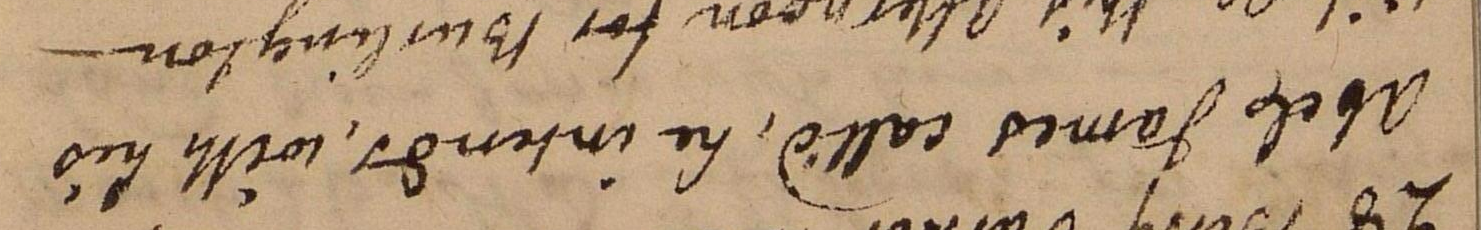Abel James call'd, he intends, with his
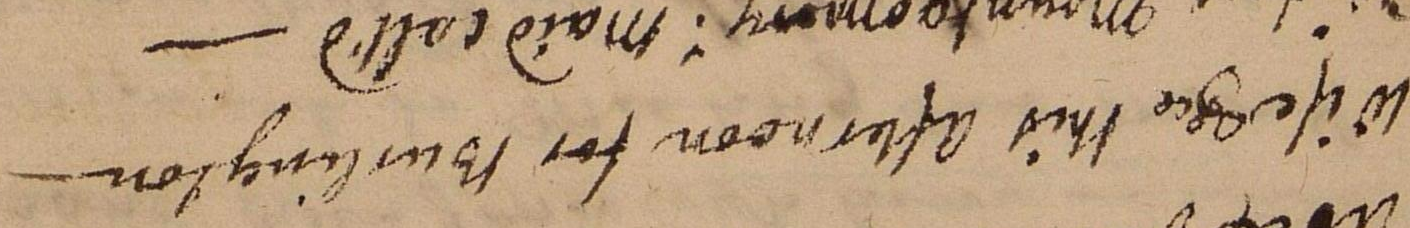Wife &ce this Afternoon for Burlington -
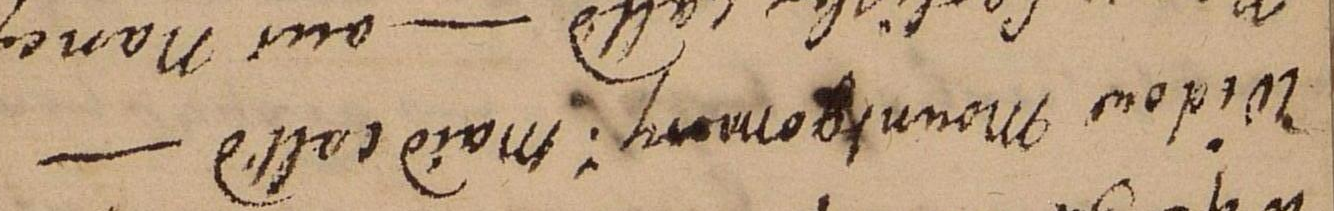Widow Mountgomery^s. Maid call'd -
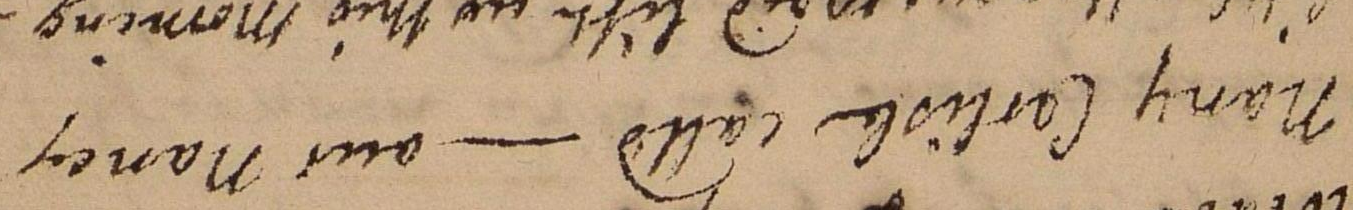Nancy Carlisle call'd- our Nancy
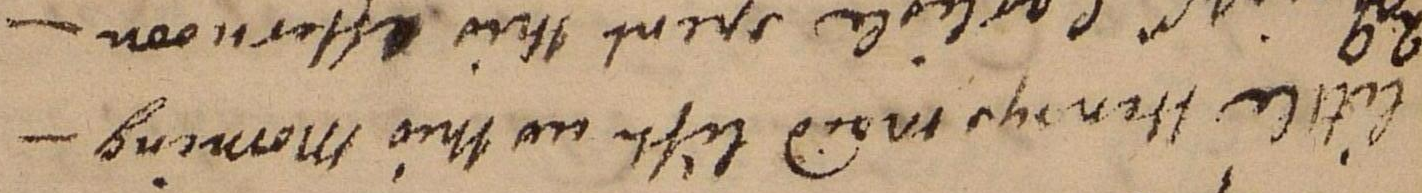little Henrys maid lift us this Morning-
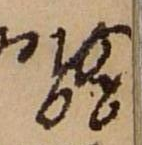29
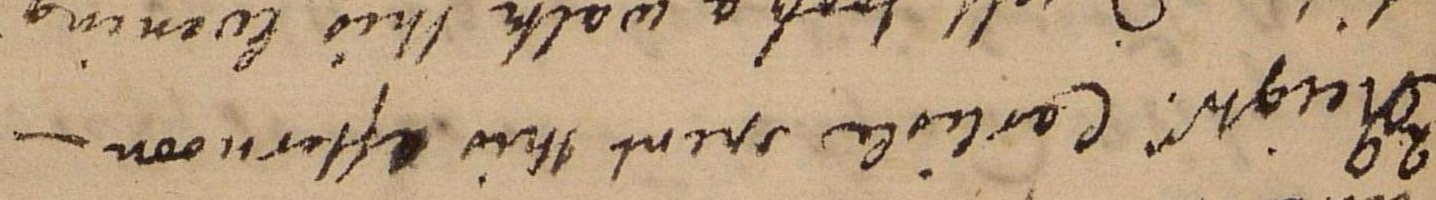Neigh^r. Carlisle spent this afternoon -
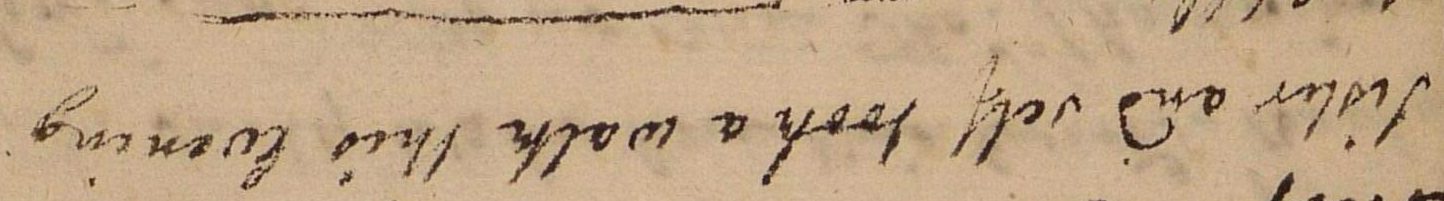Sister and self took a walk this Evening
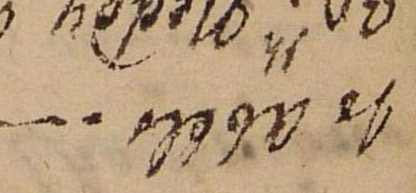to Abels -
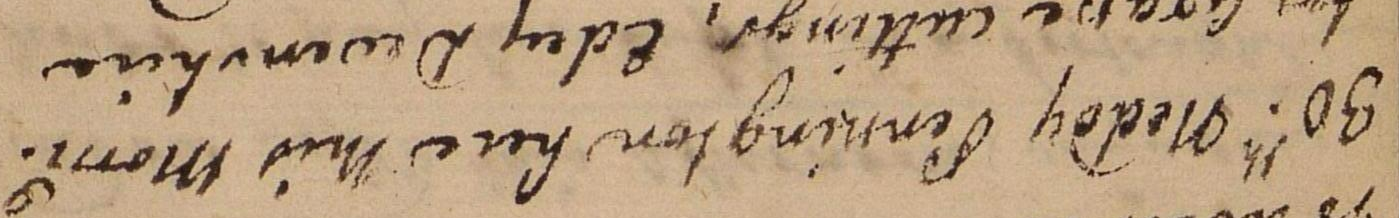30^th. Neddy Pennington here this Morn^g.
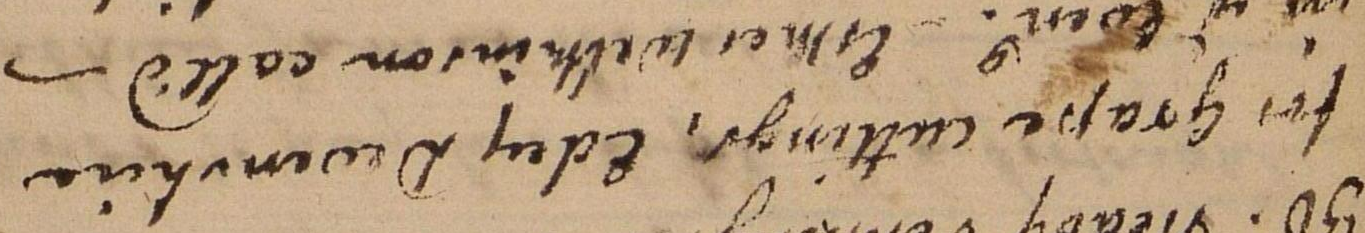for Grape cuttings, Edey Devenshire
